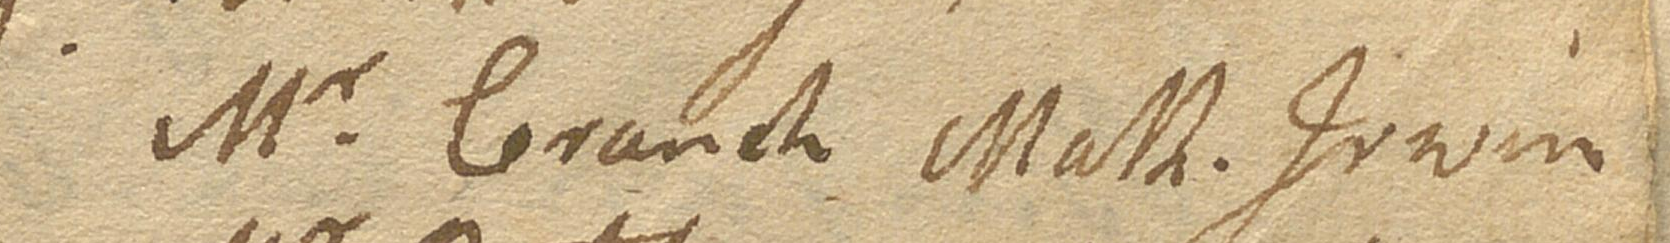M^r. Cranch Math. Irwin
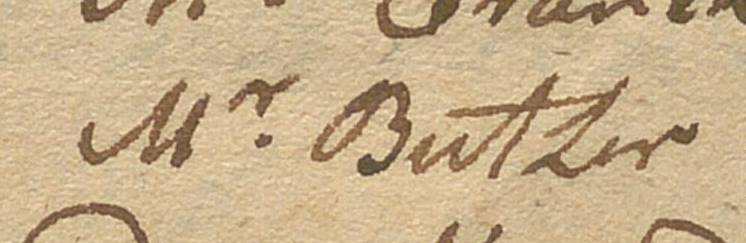M^r. Butler
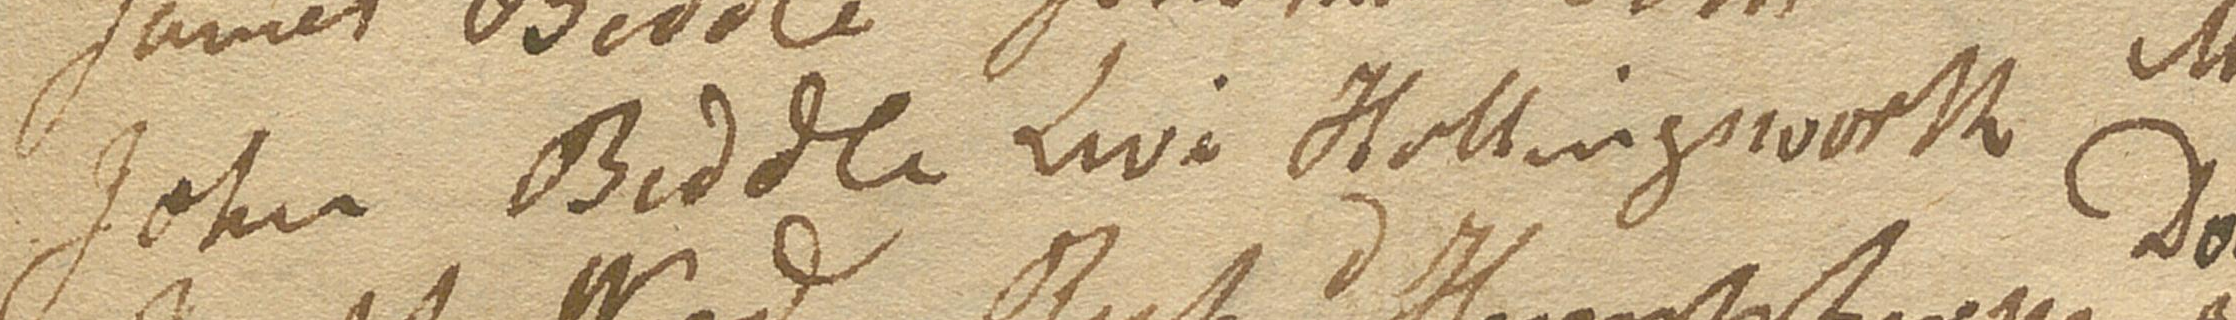John Biddle Levi Hollingsworth
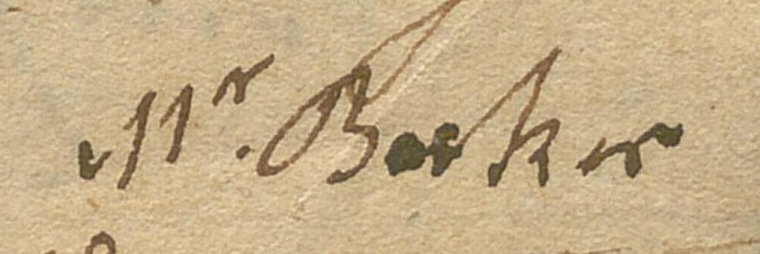M^r. Barker
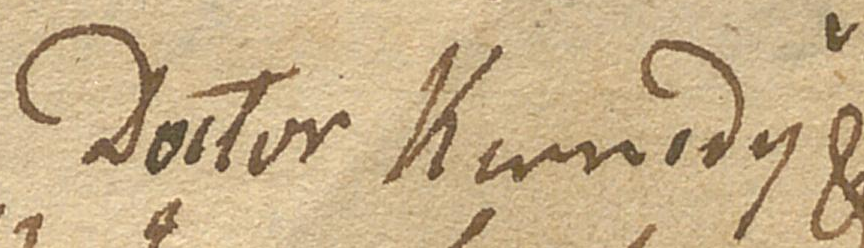Doctor Kennedy
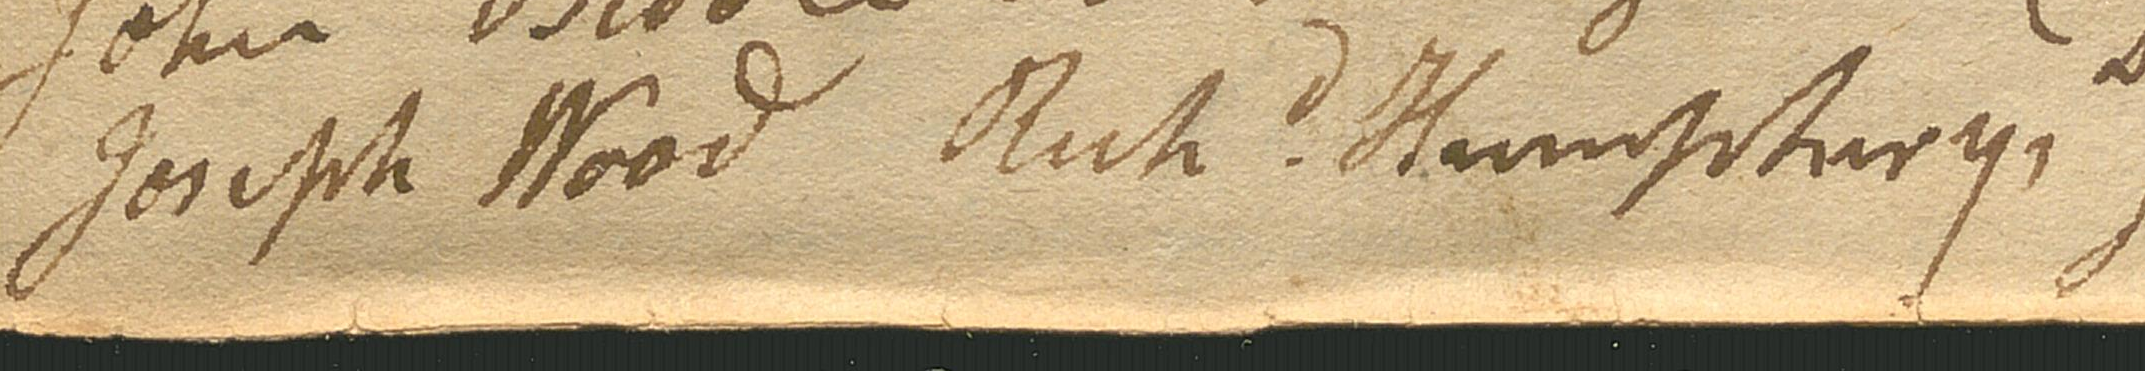Joseph Nood Richd. Humpherys
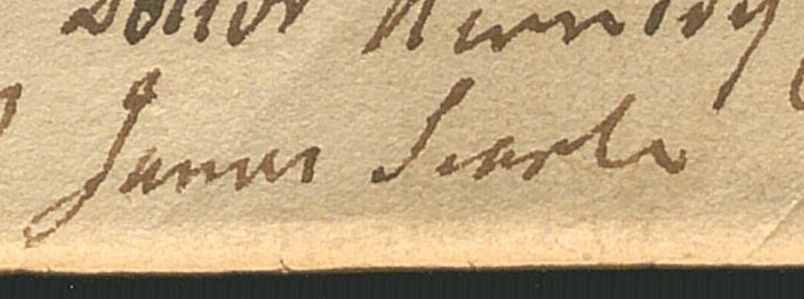James Searle
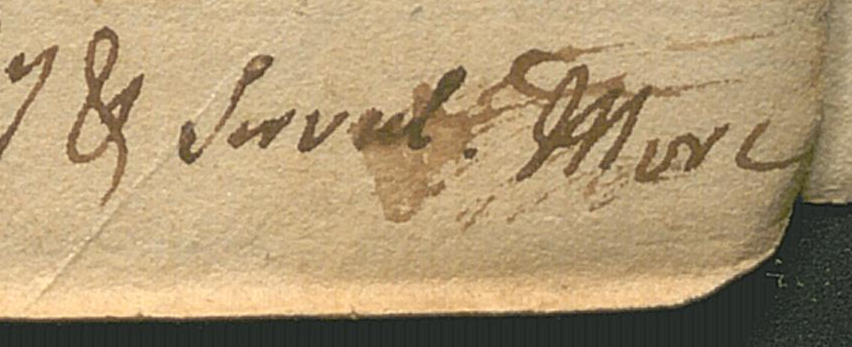& Serval More
